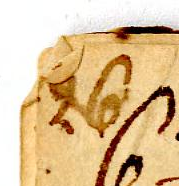26
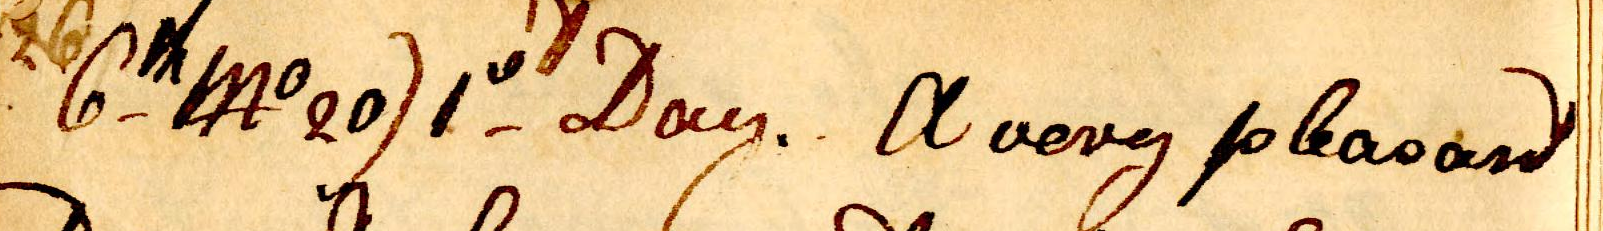6^th M^o 20) 1^st Day. A very pleasant
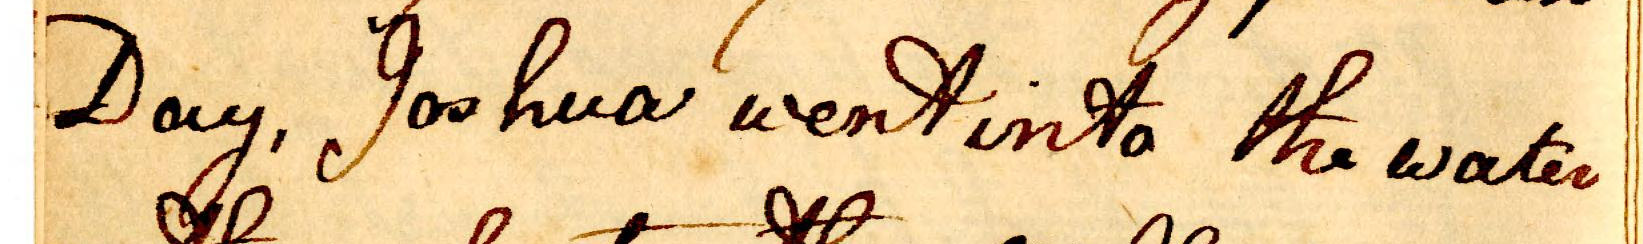Day, Joshua went into the water
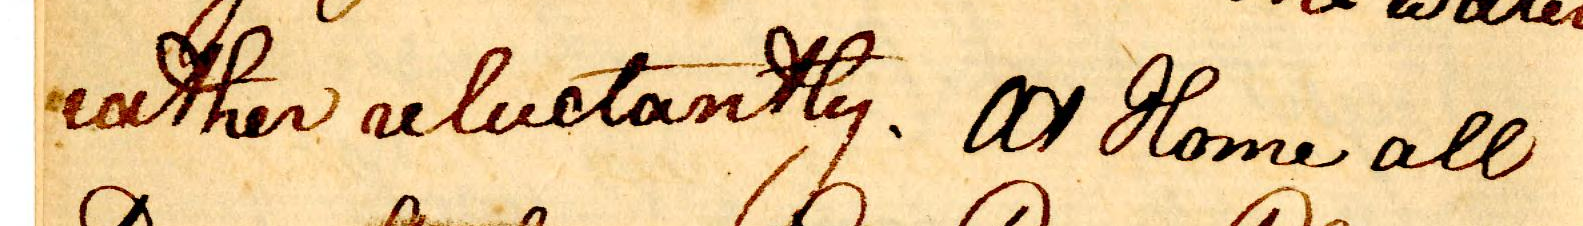rather reluctantly. At Home all
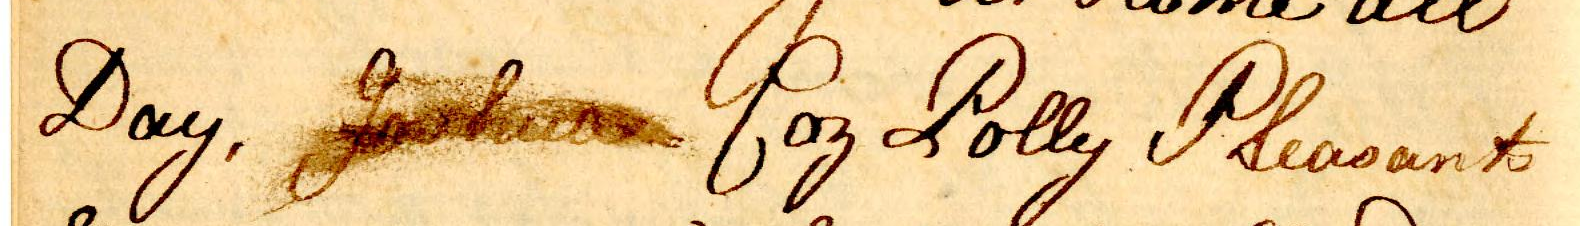Day, [Joshua] Coz Polly Pleasants
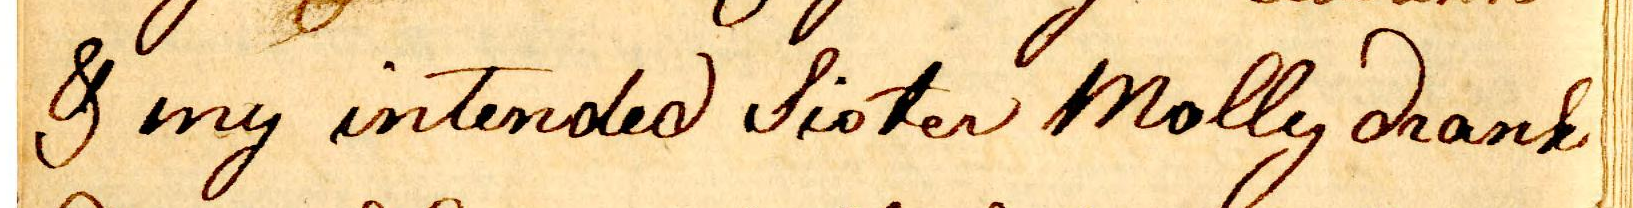& my intended Sister Molly drank
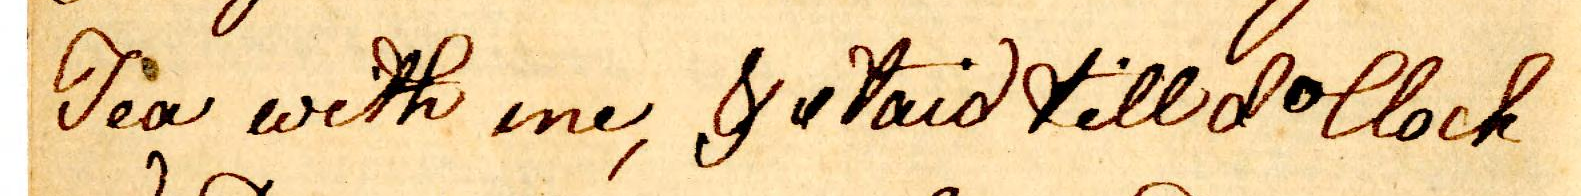Tea with me, & staid till 8 ^o Clock
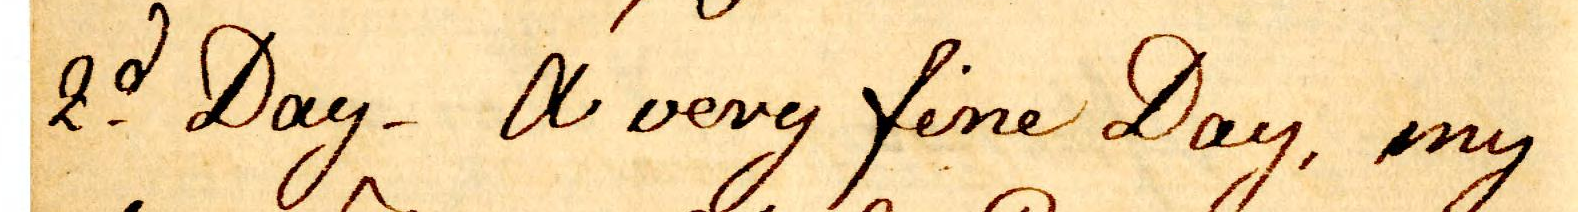2^d. Day- A very fine Day, my
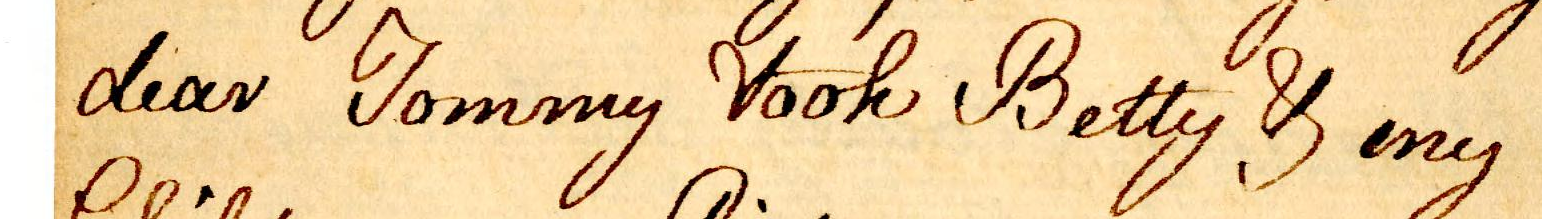dear Tommy took Betty & my
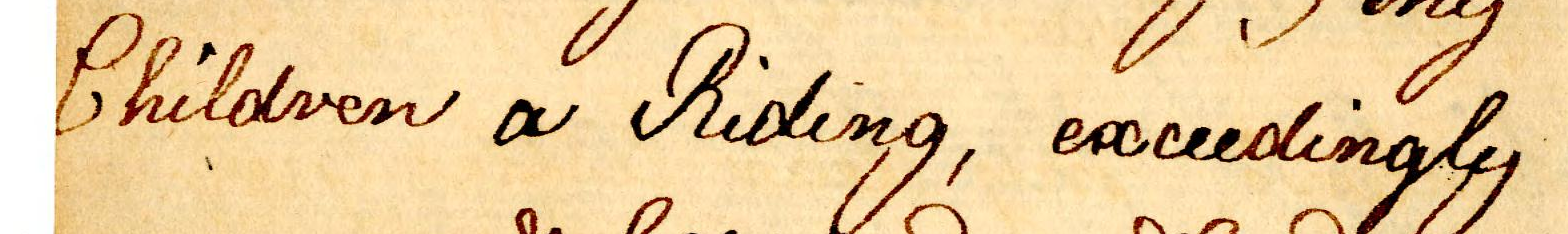Children a Riding, exceedingly
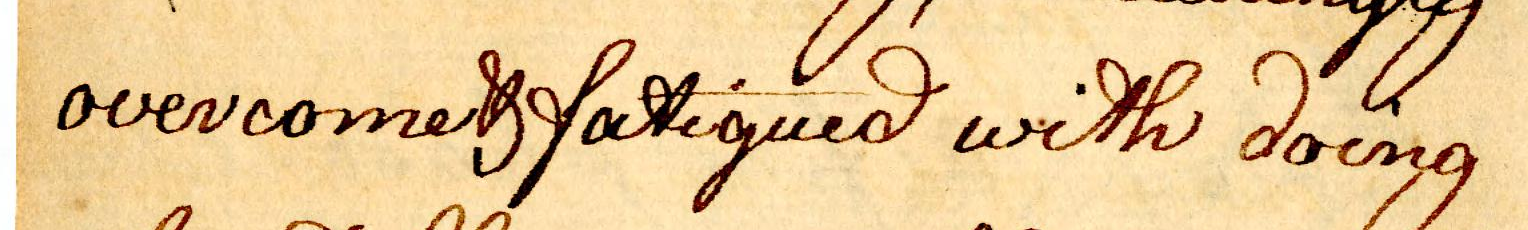overcome & fatigued with doing
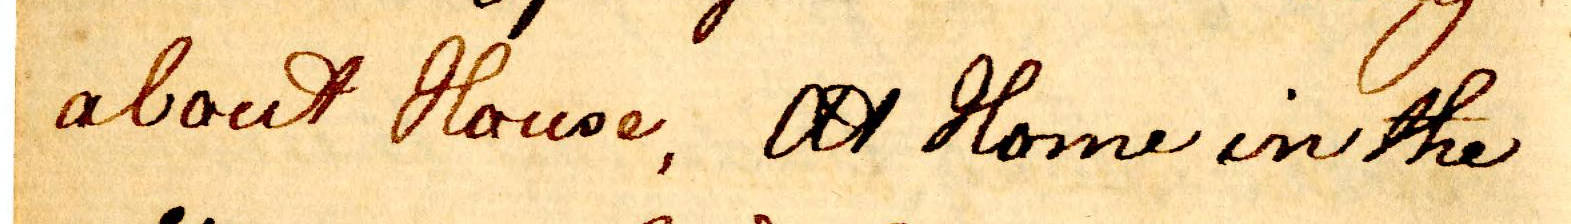about House, At Home in the
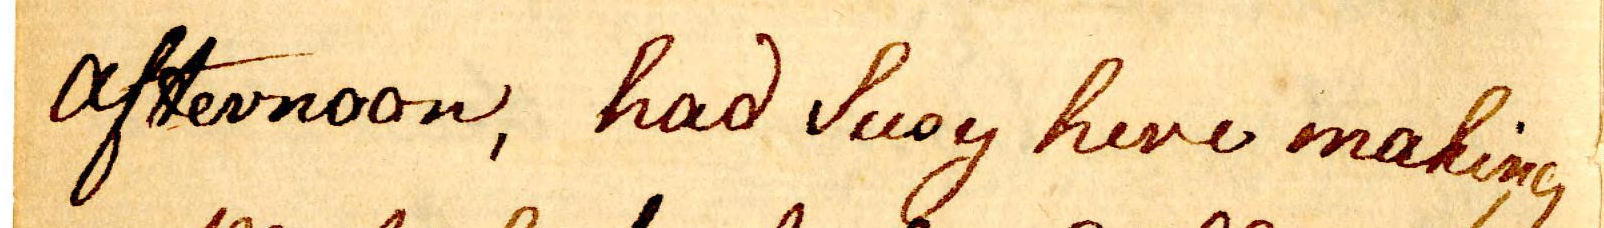Afternoon, had Susy here making
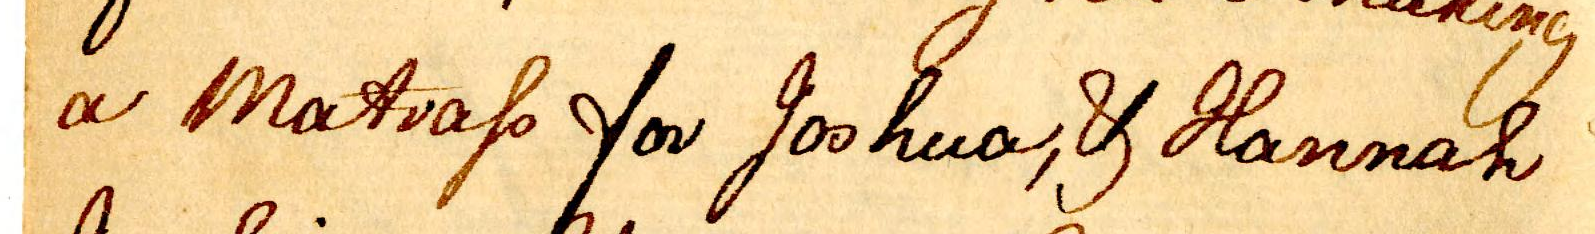a Matrass for Joshua, & Hannah
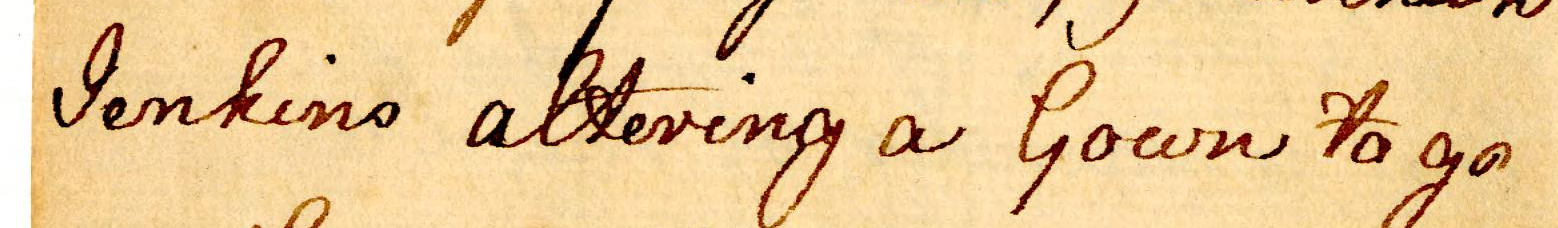Jenkins altering a Gown to go
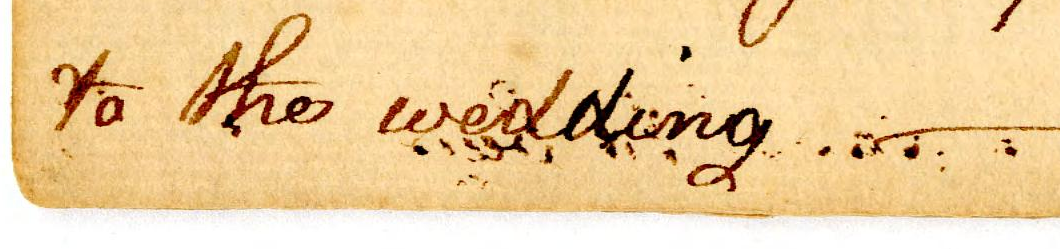to the wedding-
